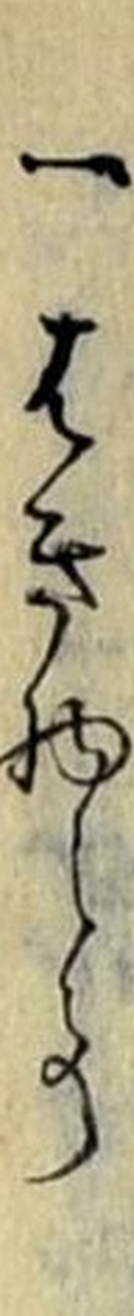一はき物之事
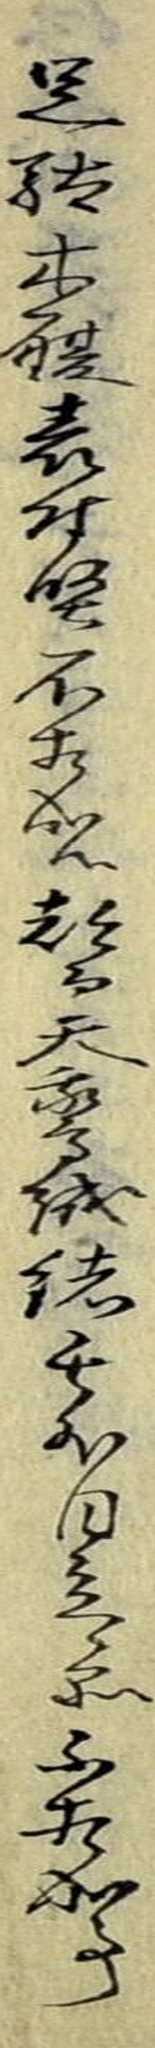足駄木履表付堅不相成候都而天鵞威結其外目立候品不相成事
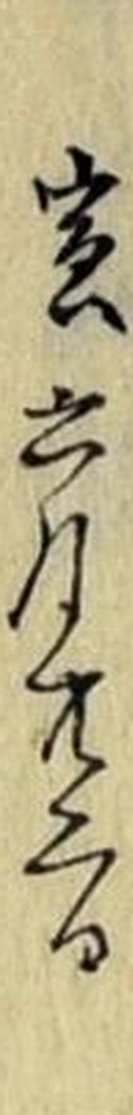寅六月廿二日
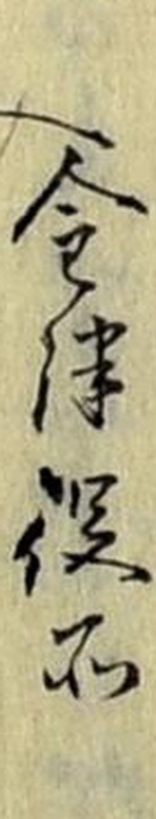金津役所
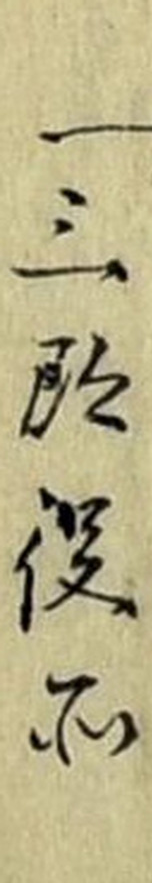三郡役所
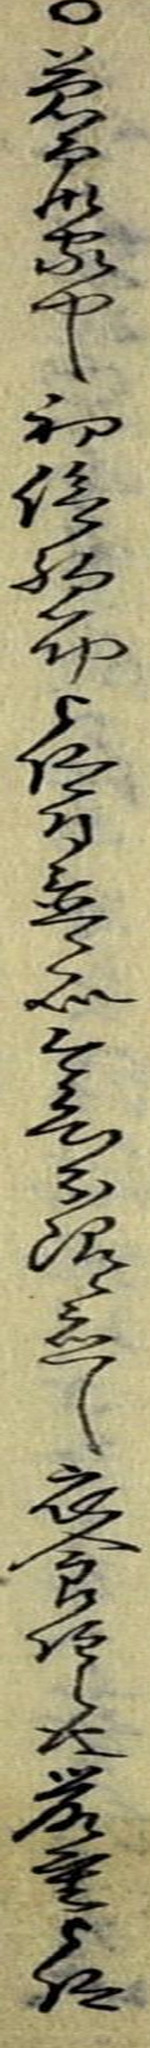○兼而御家中初倹約筋被仰付置候処今度分限に応し衣食住之儀厳重被仰
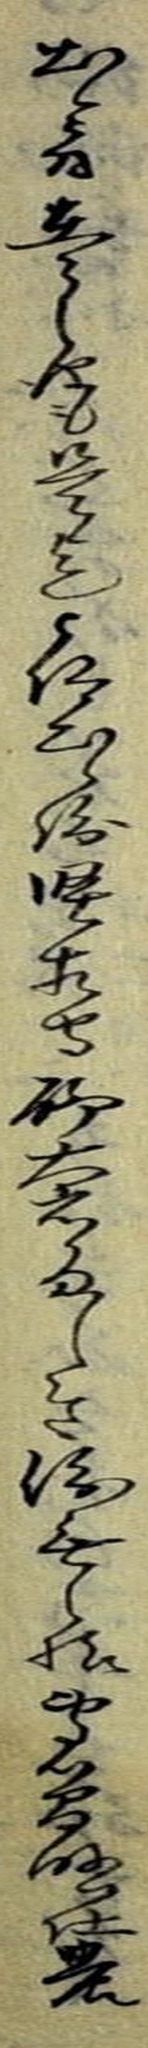出候に付在々之儀も是迄被仰出候儀堅相守聊奢ましき儀無之様専簡略仕農
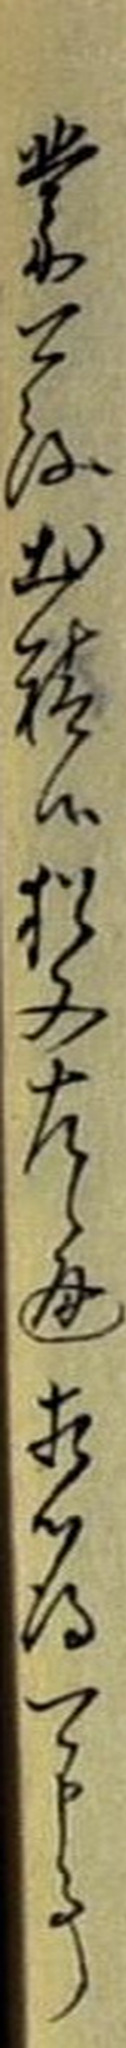業可致出精候猶又左之通相心得可申事
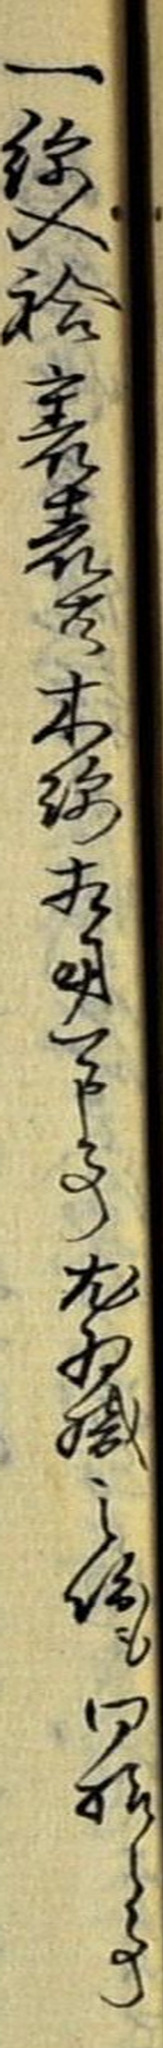一綿入袷裏表共木綿相用可申事尤羽織之儀も同様之事
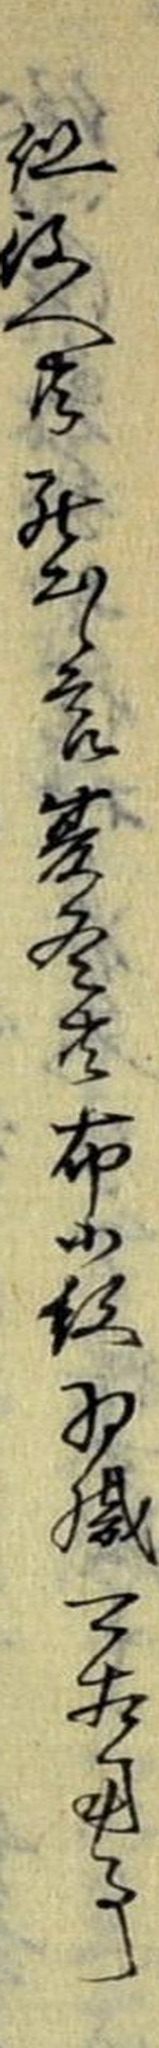但役人共罷出候節夏冬共布小紋羽織可相用事
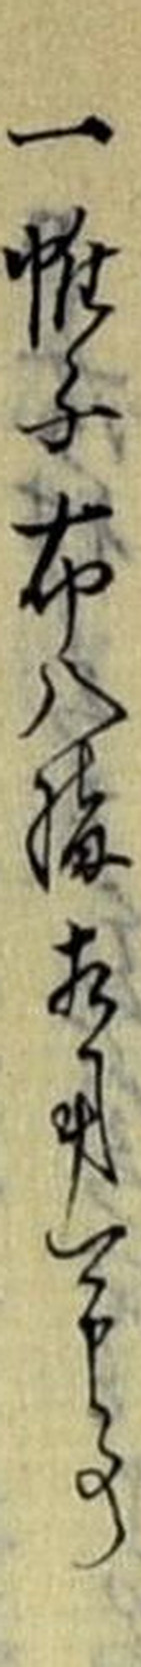一帷子布八講相用可申事
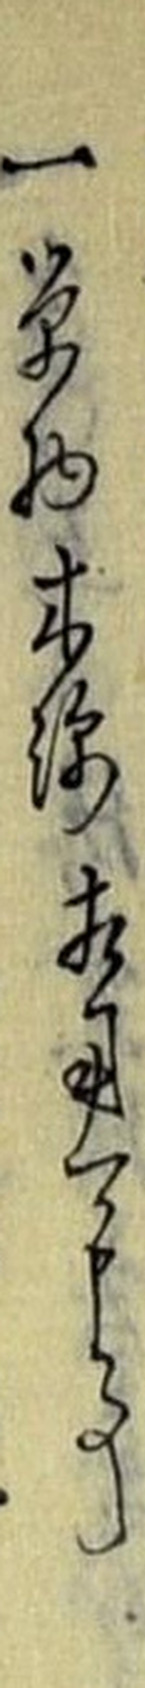一単物木綿相用可申事
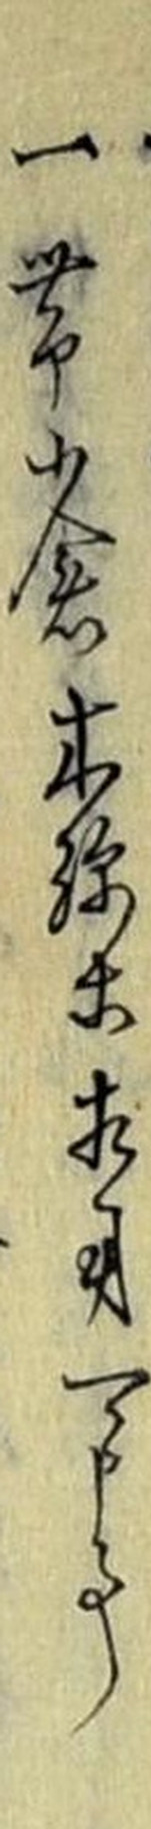一帯小倉木綿等相用可申事
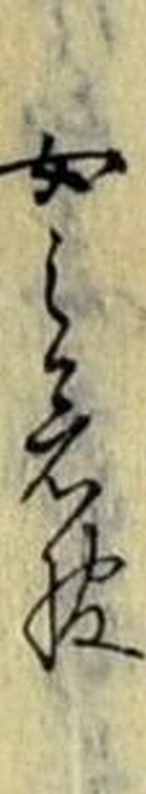女之着服
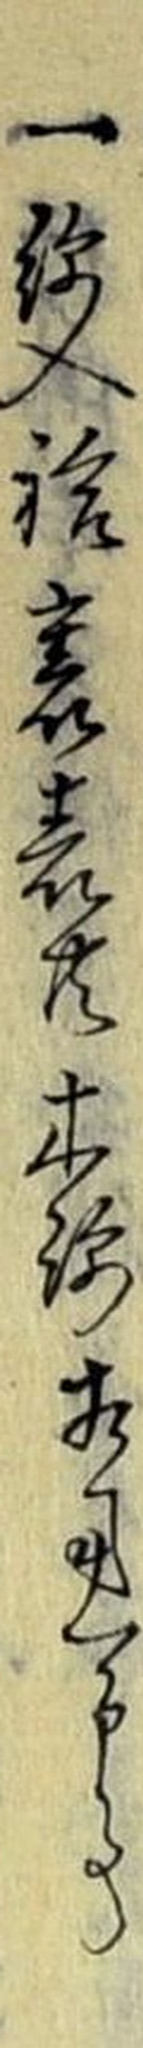一綿入袷裏表共木綿相用可申事
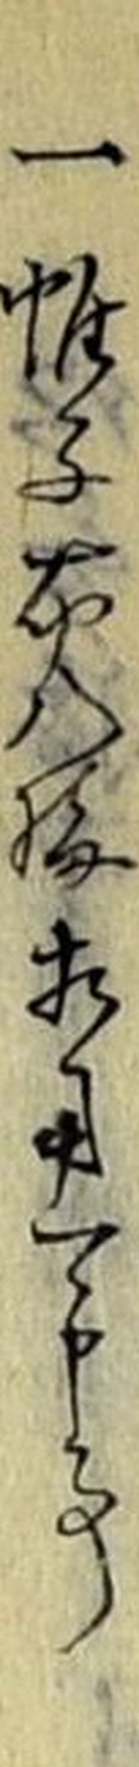一帷子布八講相用可申事
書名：命令之部 六
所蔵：福井県文書館 Fukui Prefectural Archives
